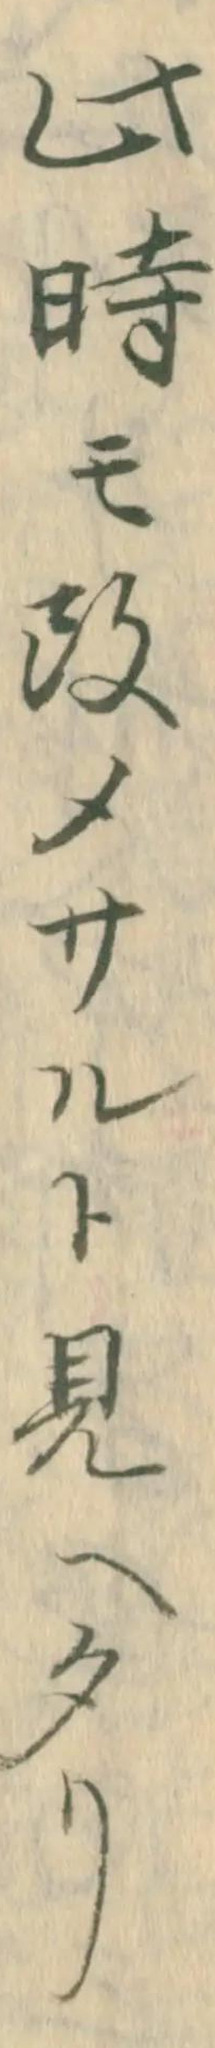此時モ改メサルト見ヘタリ

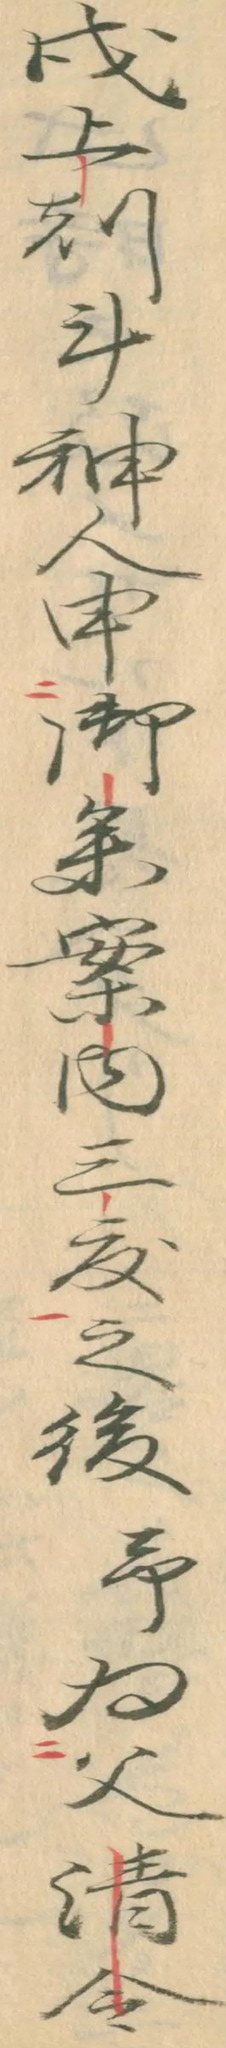戌上-刻計神人申御-参案-内三-度之後予為父清令
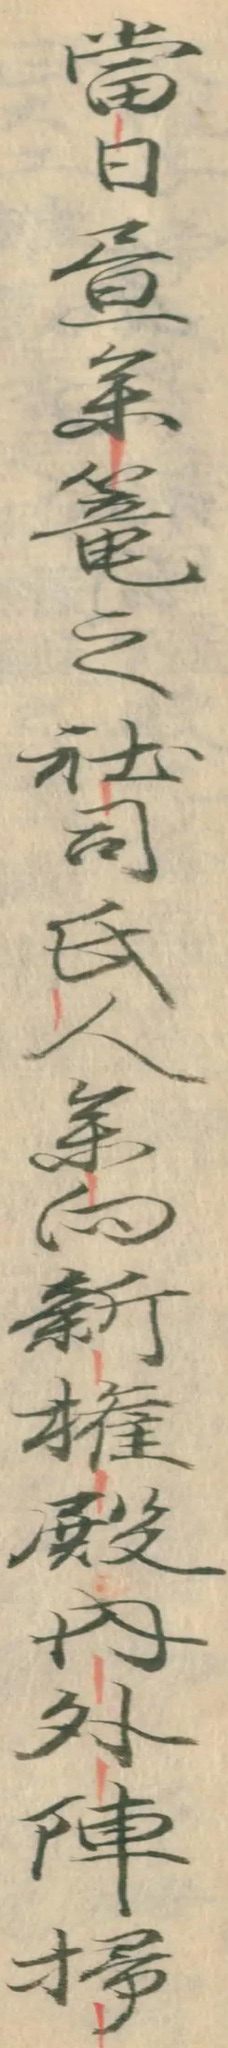当-日昼参-篭之社-司氏参-向新-権-殿内-外-陣掃-

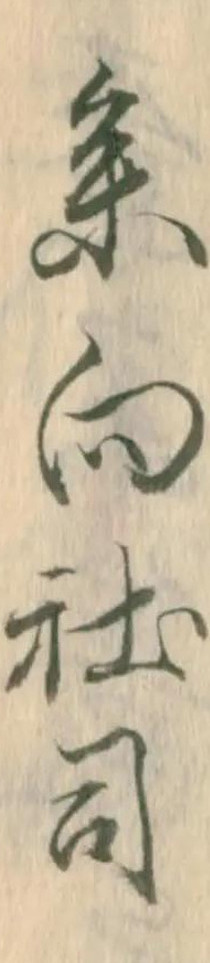参向社司

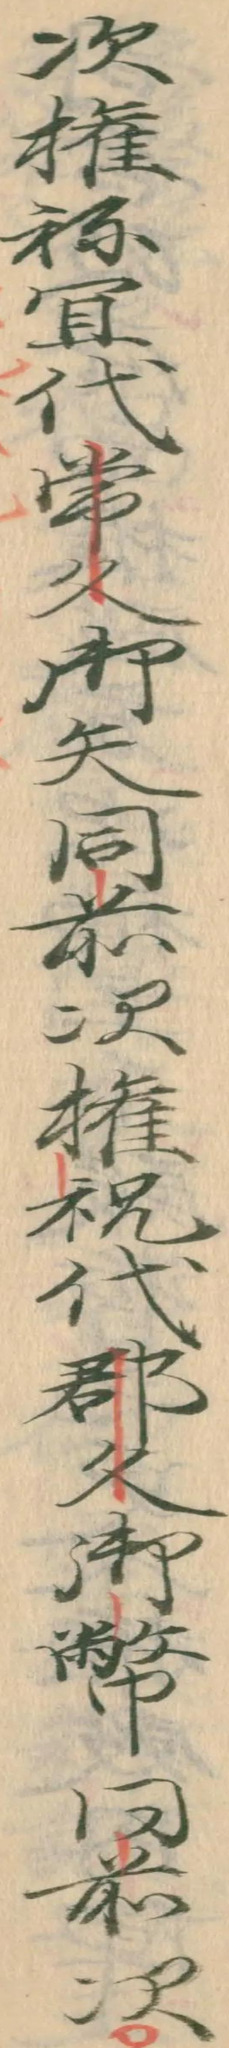次権祢宜代常久御矢同-前次権_祝代郡久御-幣同-前次￮

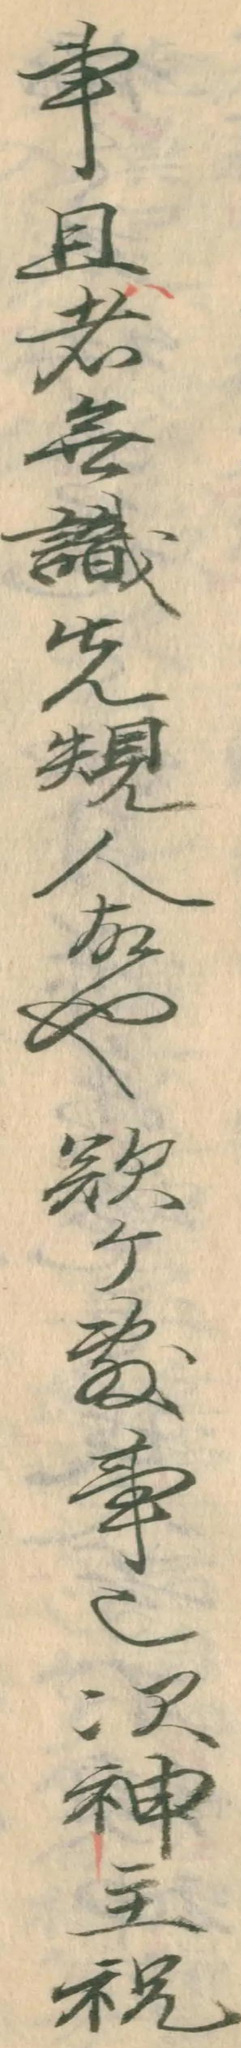事且者無識先規人故也歎ケ敷事也次神_主祝
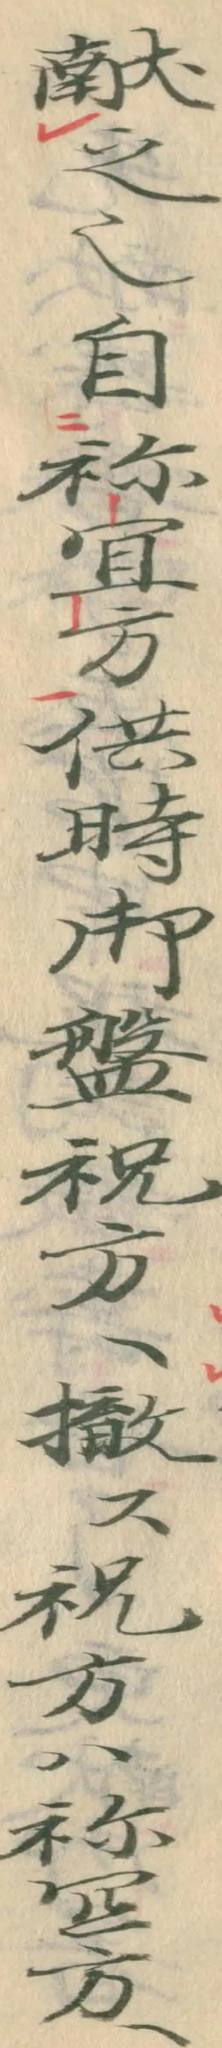献之也自祢-宜_方供時御盤祝方ヘ撤ス祝方ハ祢宜方ヘ

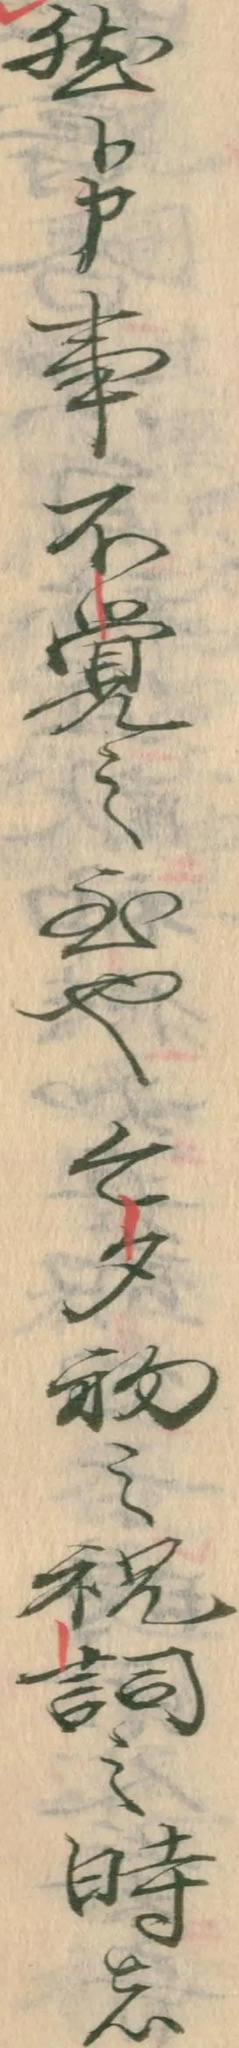然ト申事不-覚之至也今-夕初之祝_詞之時者
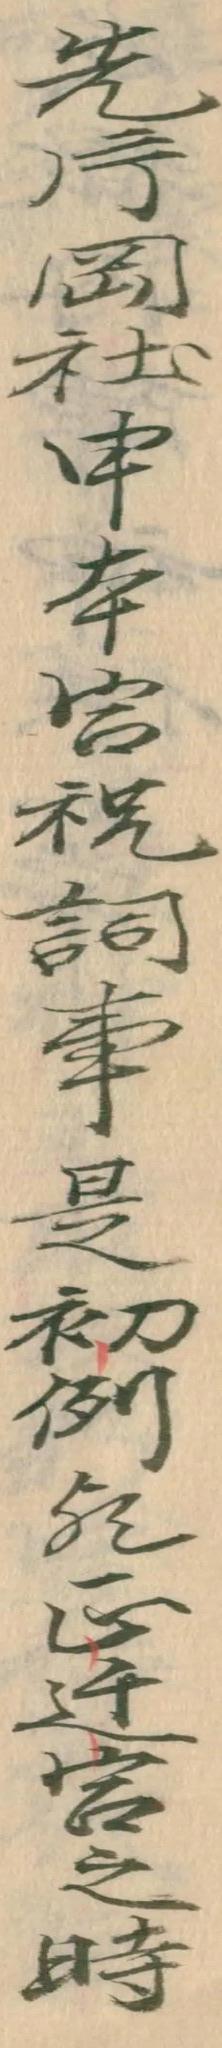先片岡社申本宮祝詞事是初-例歟正-迁-宮之時
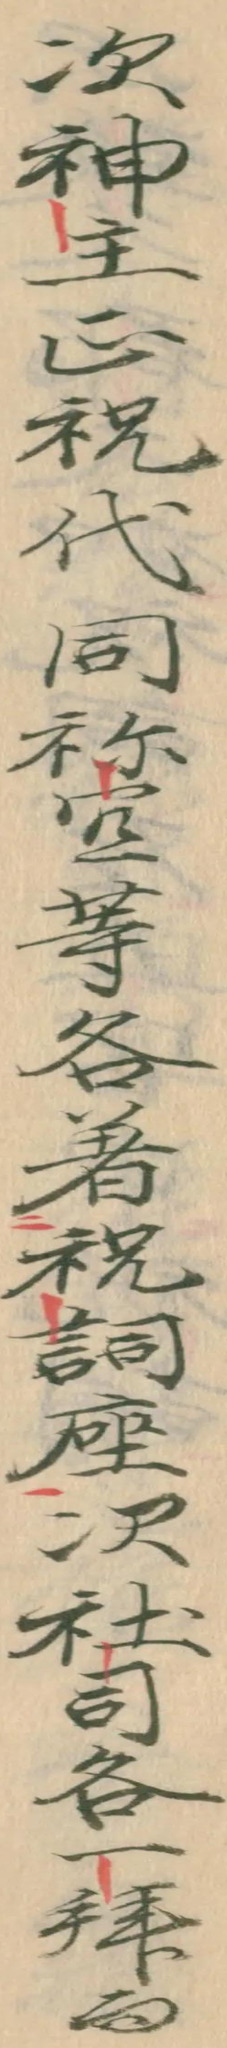次神_主正祝代同祢-宜等各着祝_詞座次社-司各一-拝而
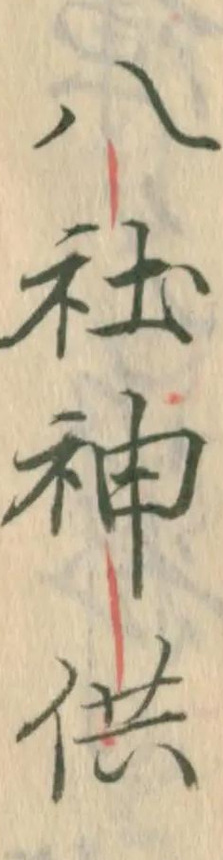八-社神-供

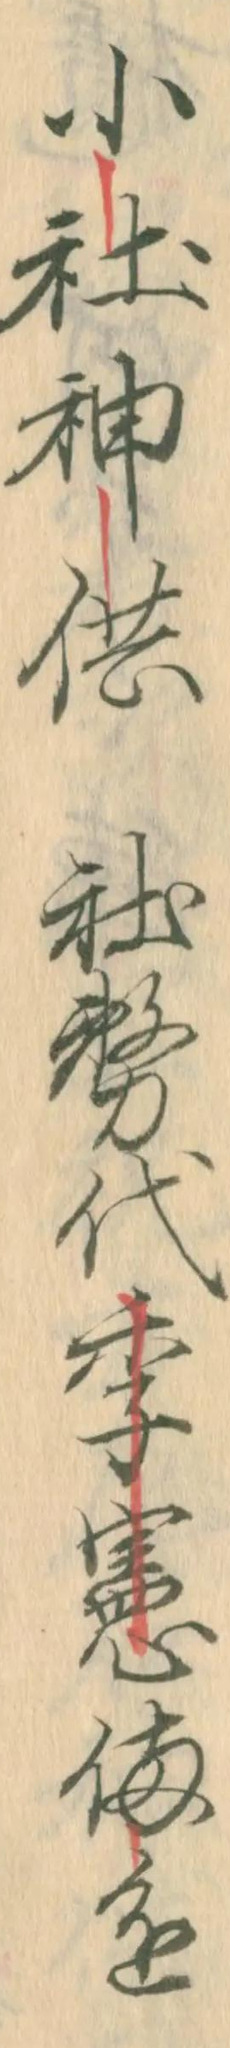小-社神-供社務代季憲備-進
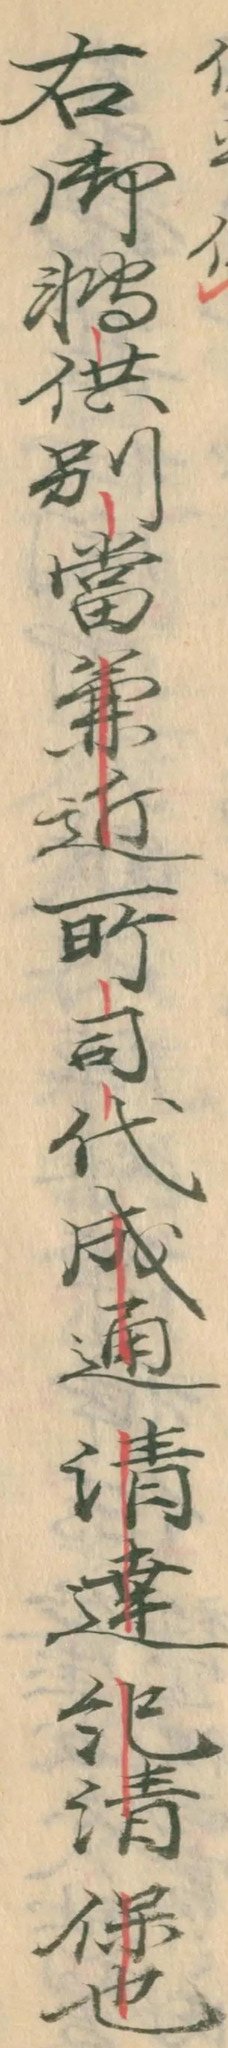右御転-供別-当兼近所-司-代成通清達紀清保也
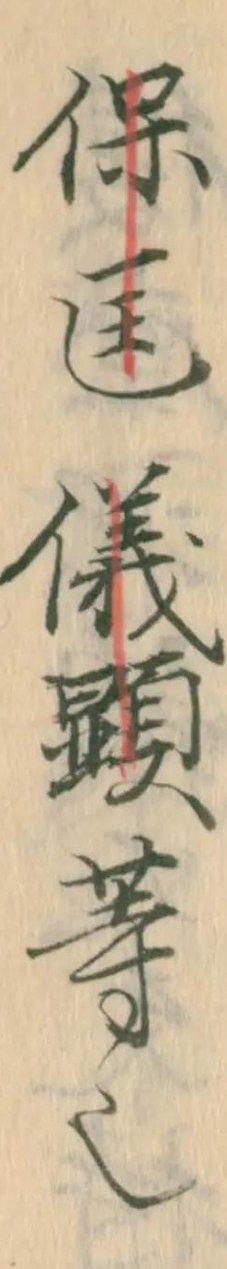保匡儀顕等也
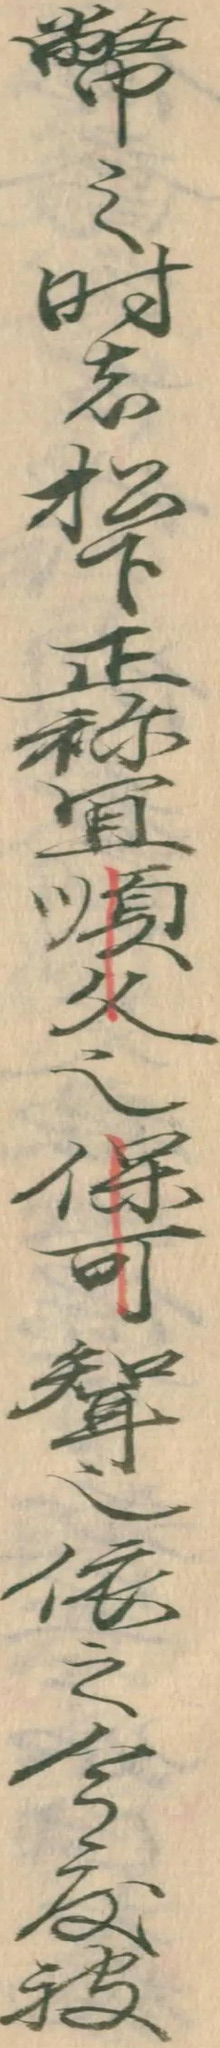幣之時者松下正祢宜順久也保可聟也依之今度被
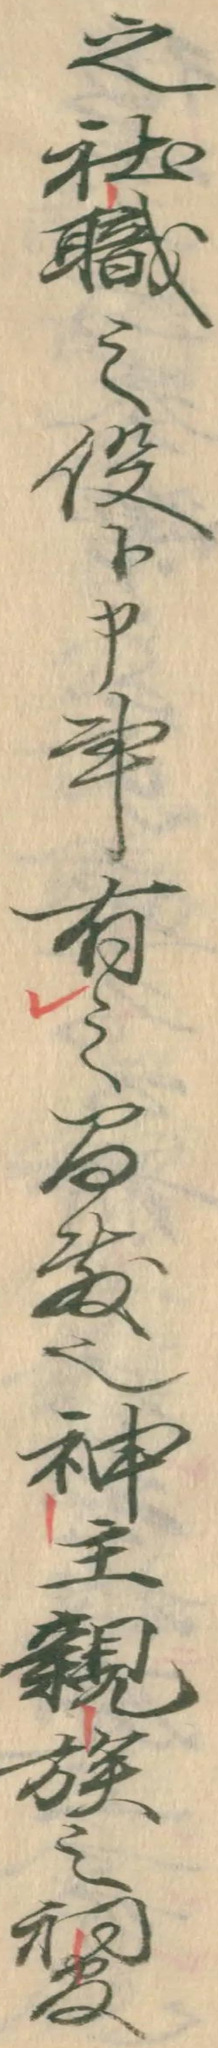之社-職之役ト申事有之間敷也神_主親-族之祠-官
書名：賀茂社記録. 第15冊
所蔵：国立国会図書館 National Diet Library, JAPAN
